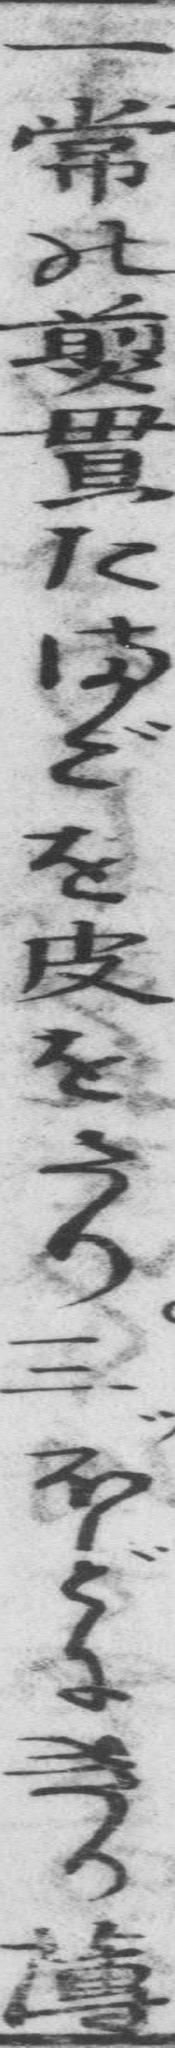一常の煎貫たまごを皮をさり。三ツほどにきり。薄
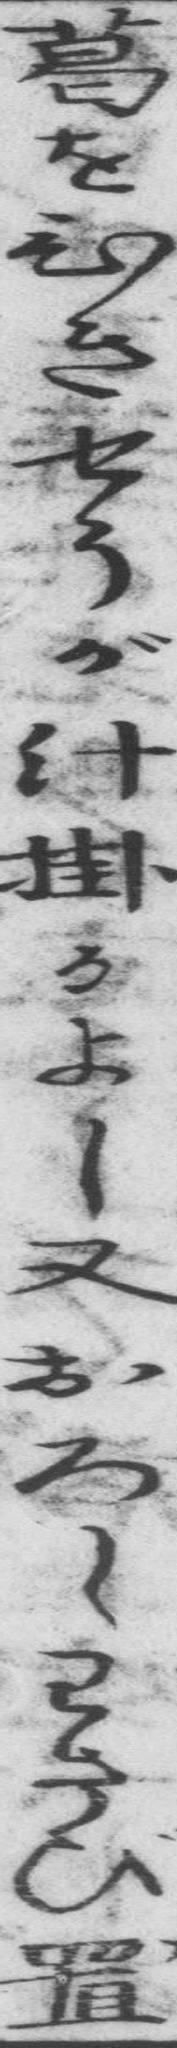葛をひき。せうが汁掛るよし。又おろしわさび置
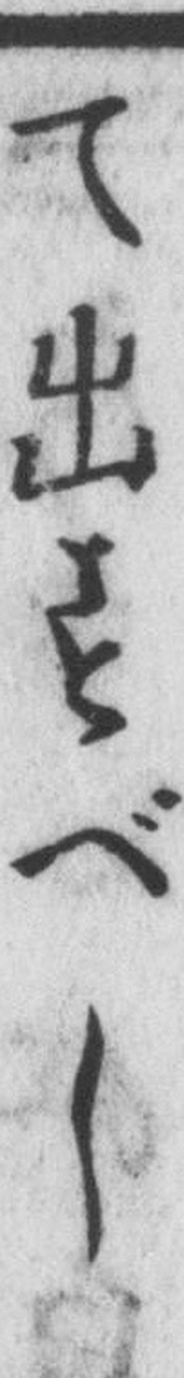て出すべし
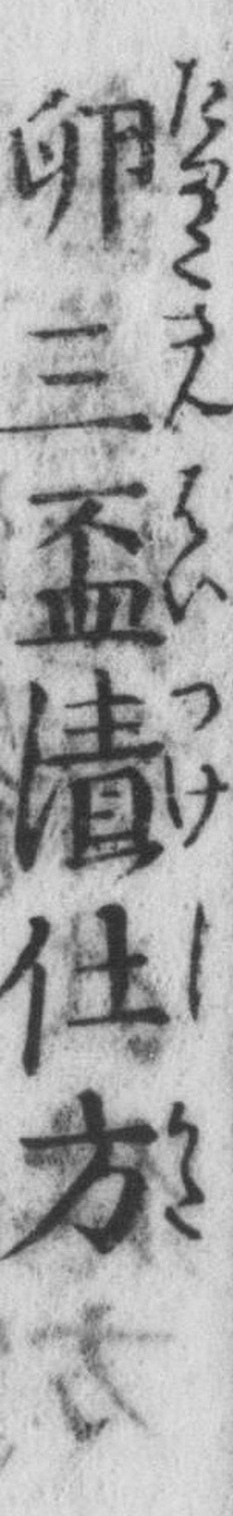卵三盃漬仕方
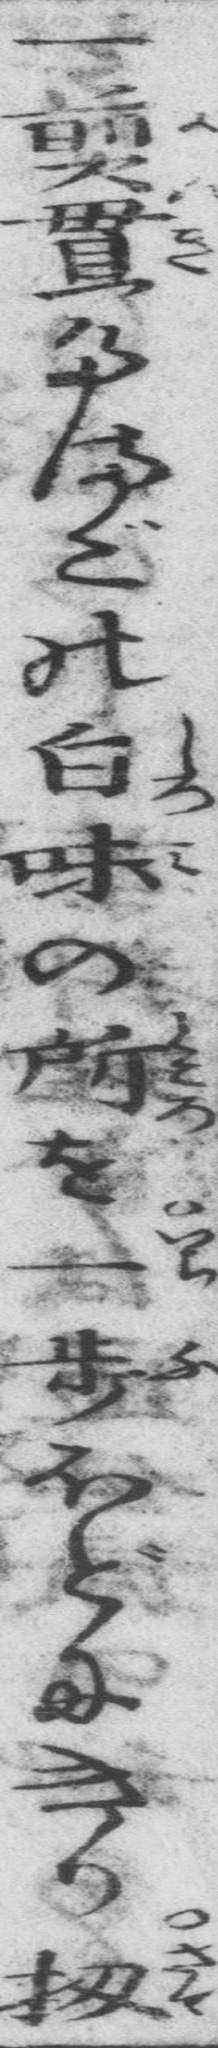一煎貫たまごの白味の所を。一歩ほどにきり。扨
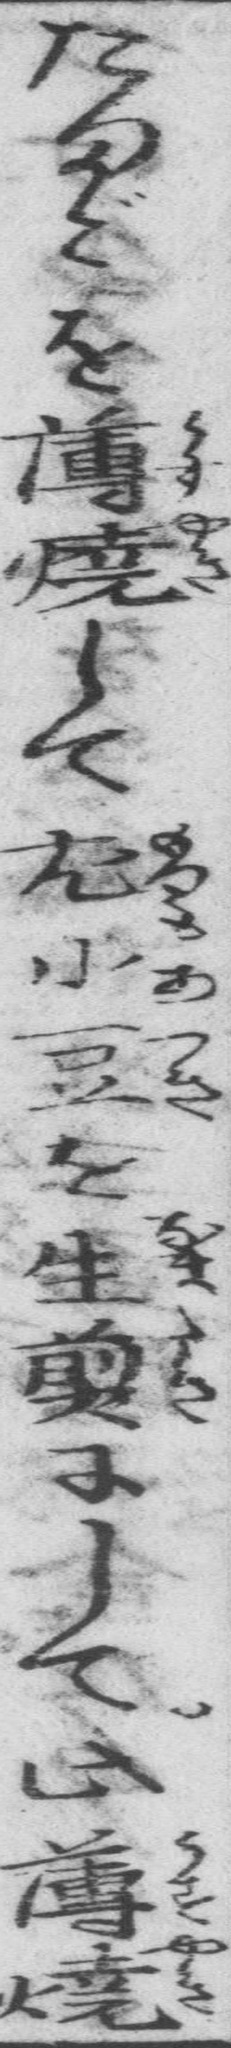たまごを薄焼して尤小豆を生煎にして。此薄焼
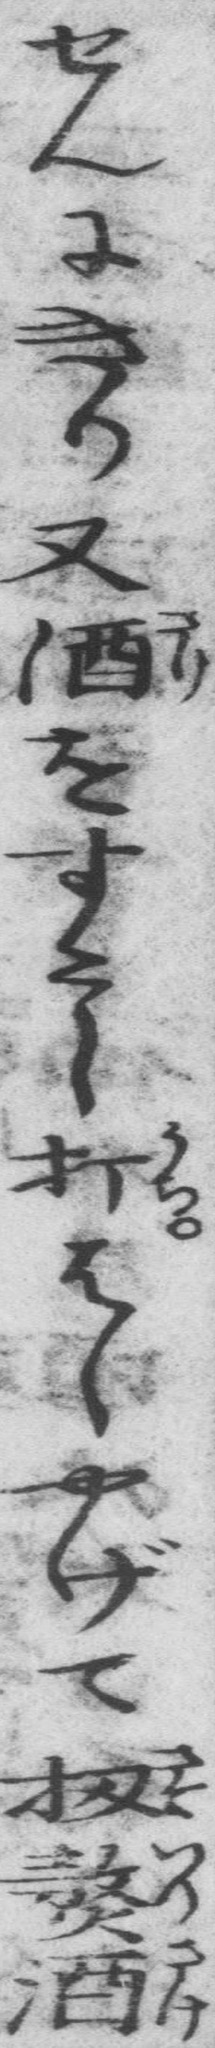せんにきり又酒をすこし打。はしやげて扨熬酒

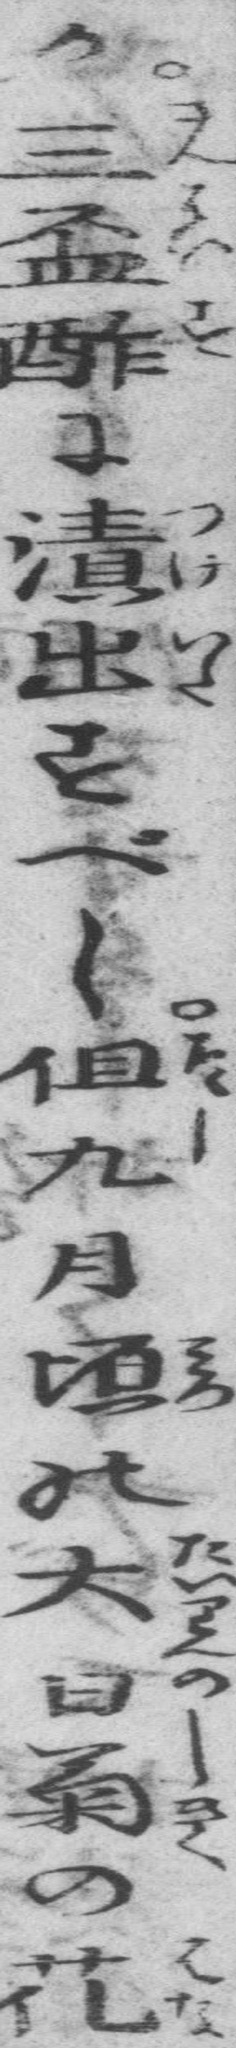か。三盃酢に漬出すべし。但九月頃の大日菊の花
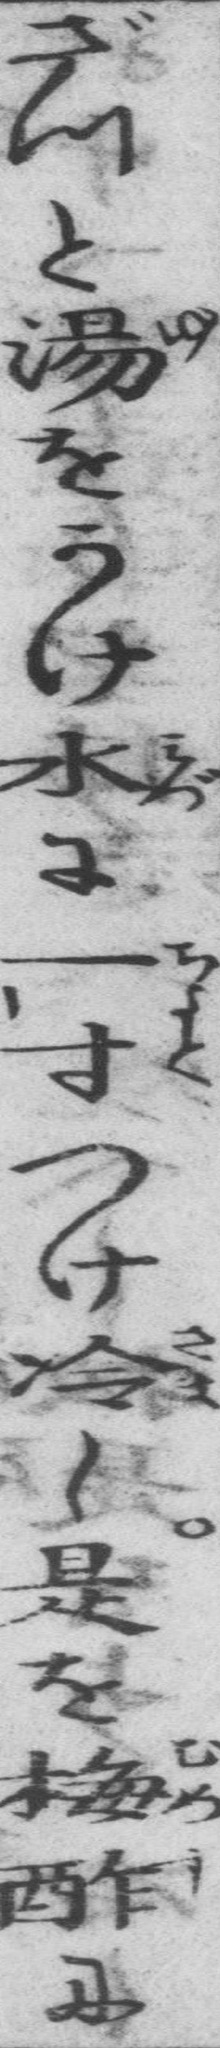ざつと湯をかけ水に一寸つけ冷し。是を梅酢に
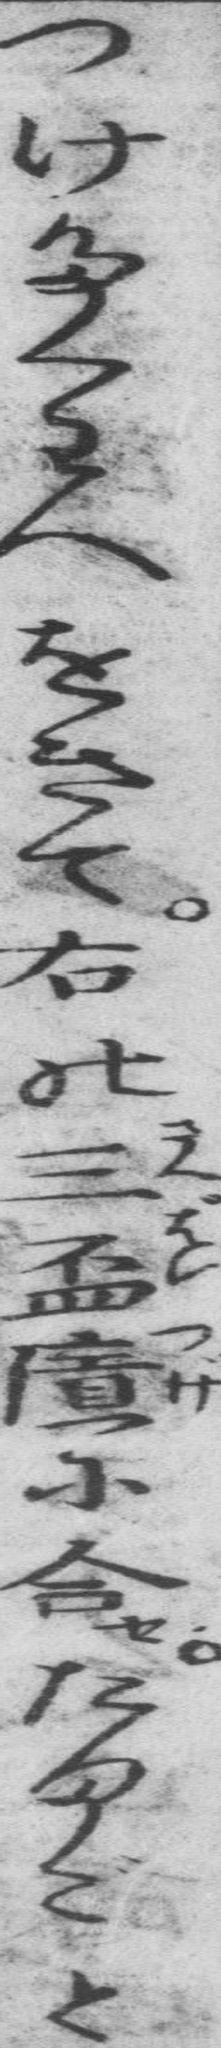つけたくわへをきて。右の三盃漬に合せ。たまごと
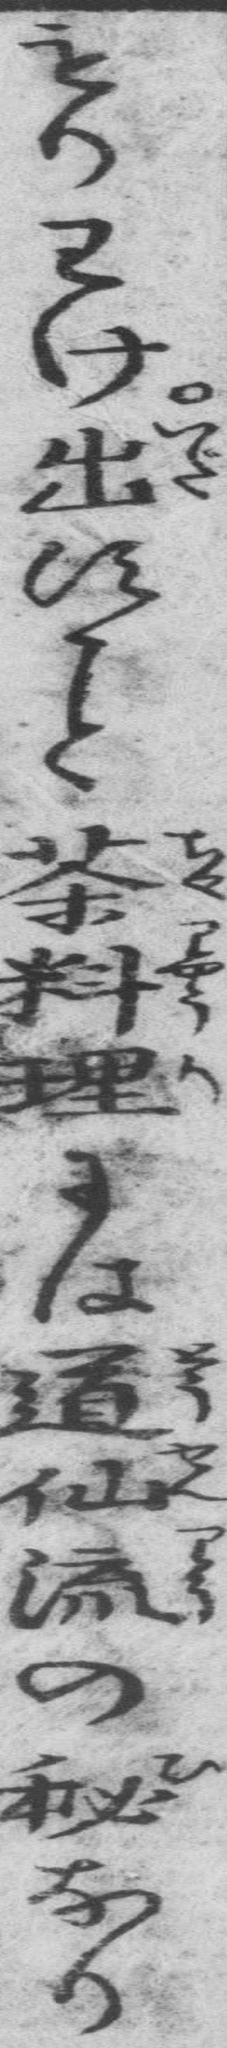もりわけ。出すこと茶料理には道仙流の秘なり
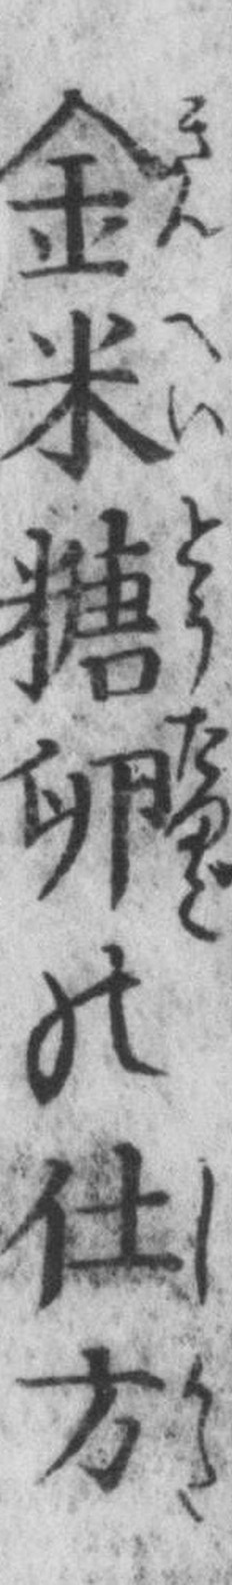金平糖卵の仕方
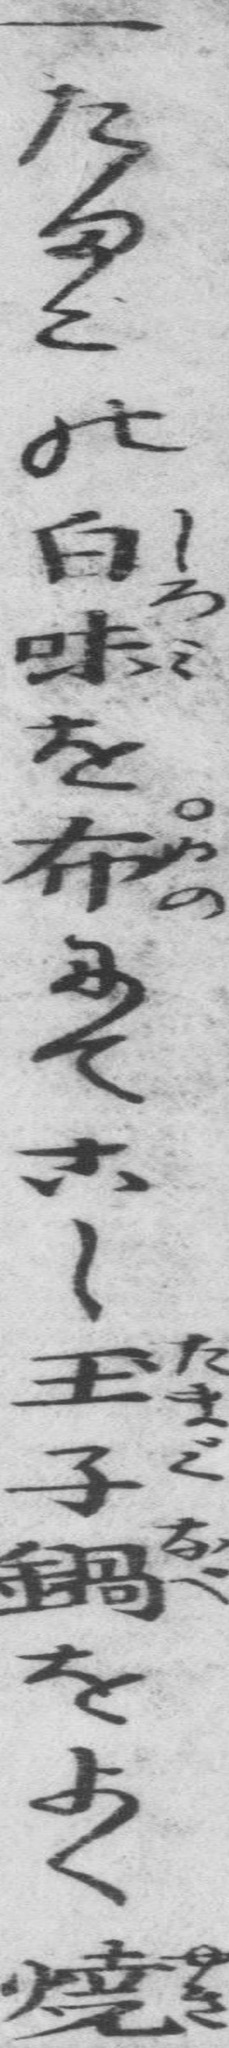一たまこの白味を。布にてこし玉子鍋をよく焼
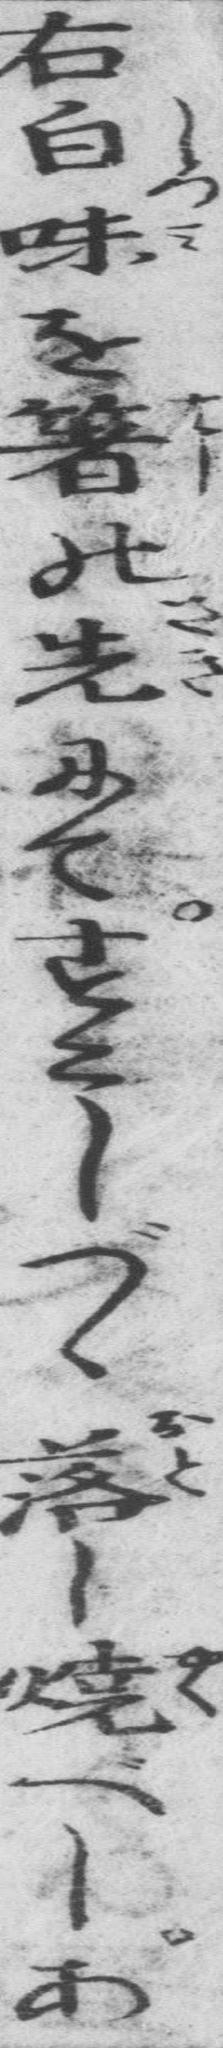右白味を箸の先にて。すこしづゝ落し焼べし。あ
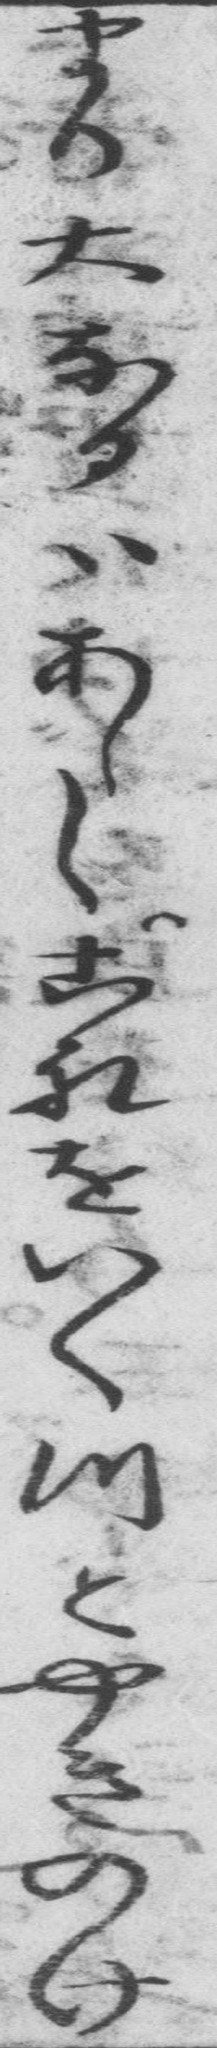まり大なるはあしし。これをいくつとやきのけ
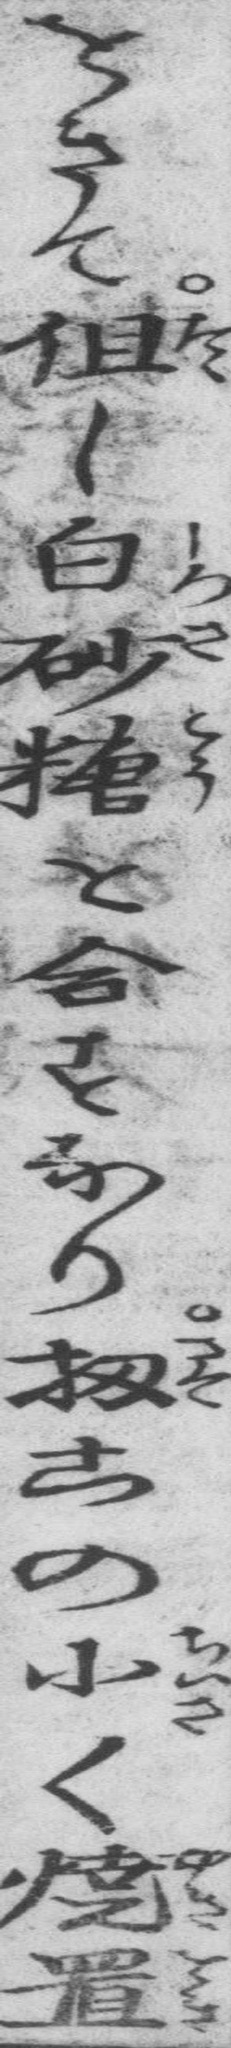をきて。但し白砂糖と合すなり。扨この小く焼置
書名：萬寳料理秘密箱
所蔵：大阪府立大学学術情報センター 国文学研究資料館
